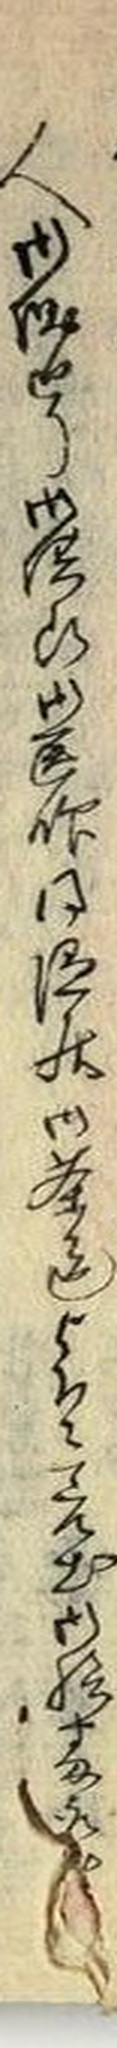人御側廻り御供頭御医師同隠居御茶道被下ニ差出御膳番取計
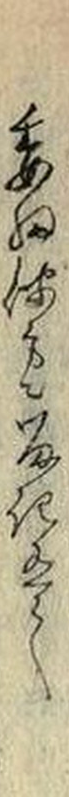委細彼方ニ留記有之
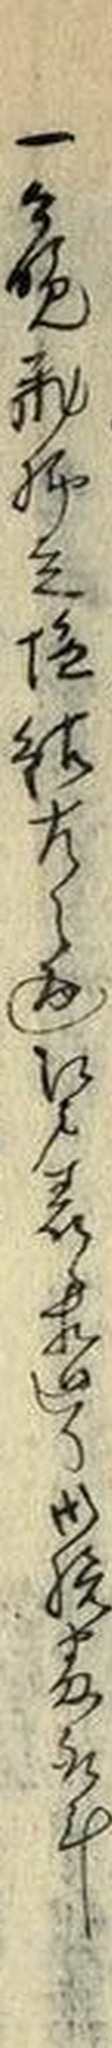一今晩飛脚立塩鮎左之通江戸表へ相廻り御膳番取計
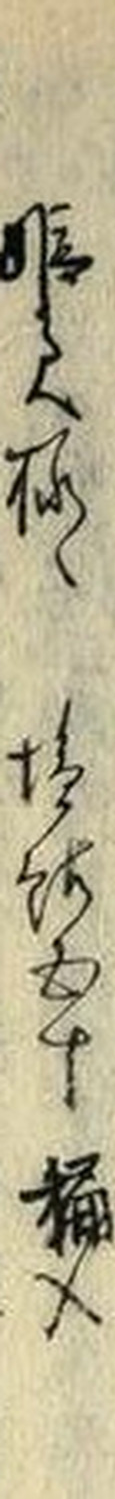姫君様へ塩鮎五十桶入
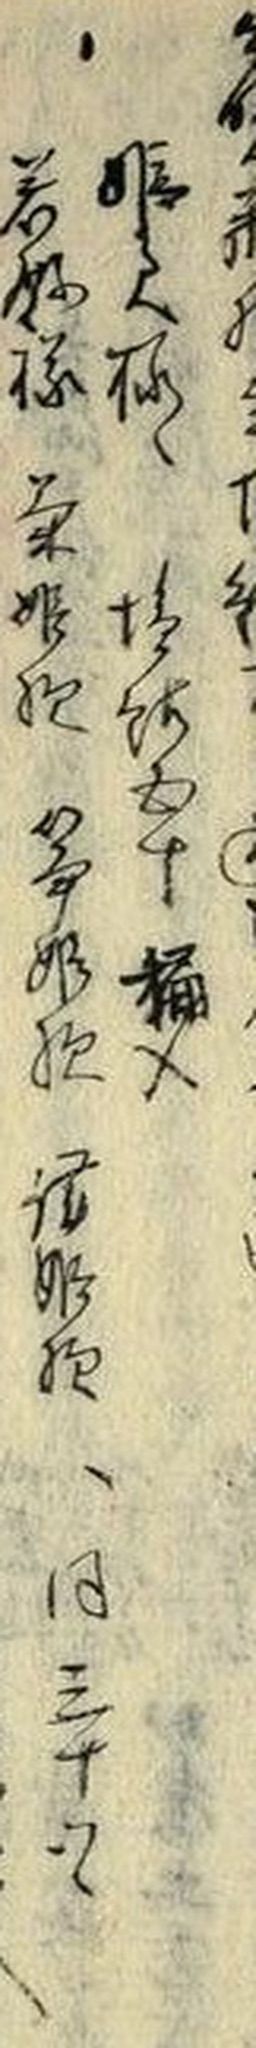若殿様菊姫様箏姫様謹姫様へ同三十ツヽ
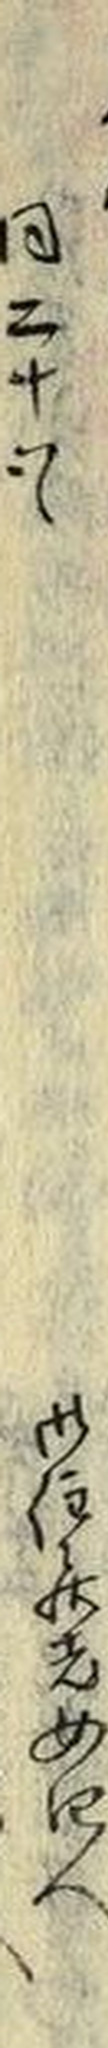同二十ツヽ御住居老女四人
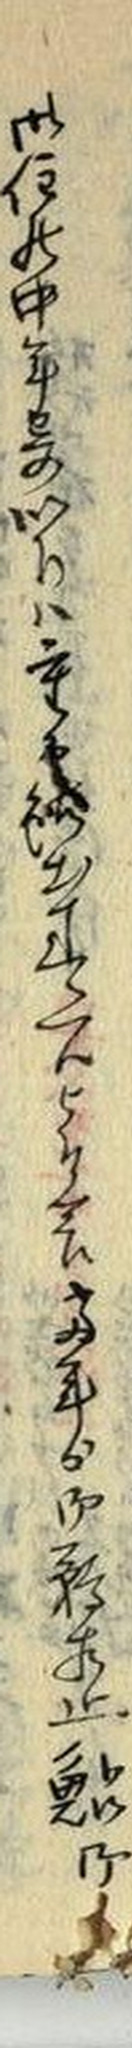御住居中年寄以下ハ重而鮎出来候へハ被下候筈当年ゟ御鵜相止鮎御
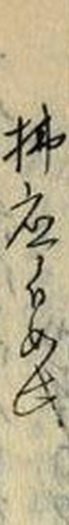払底ニ付如此
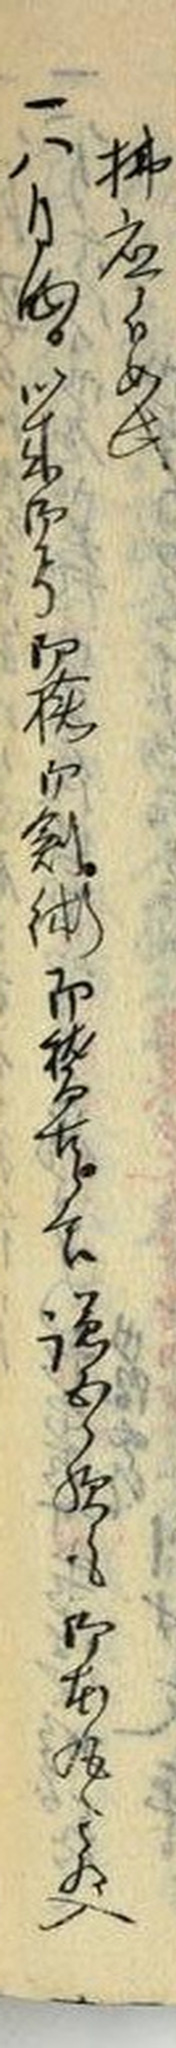一八月晦日以来御弓御槍御剣術御稽古之節謙五郎様ニも御本丸へ被為入
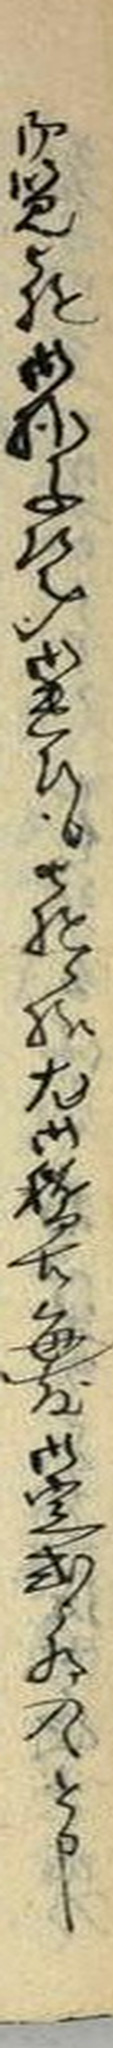御覧被遊御様子次第御遣ひも被遊候様尤御稽古毎度御定式ニ被為入候と申
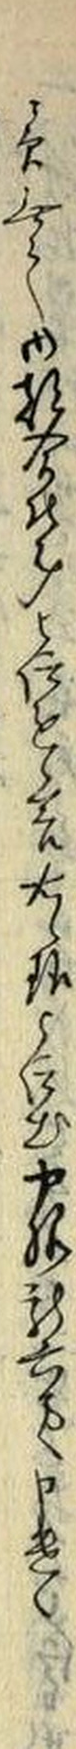ニ而ハ無之御都合次第被仰進候筈右之趣被仰出中根新六方へ申遣候
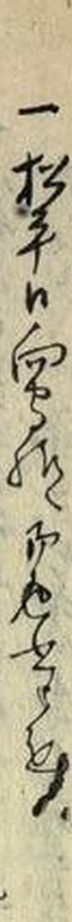一松平日向守様へ御返書被進
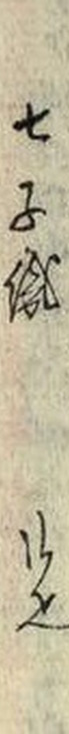七子織弐疋
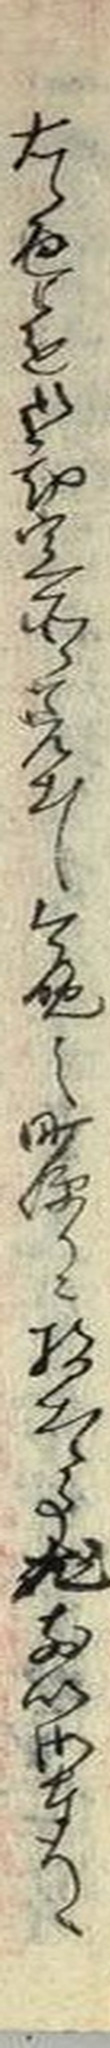右之通被進御勘定所へ差出候今晩之町便りニ指出候事尤前以御奉行へ
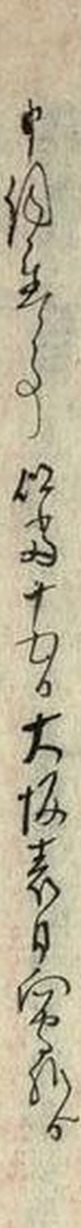申伺置候事但当十五日大坂表日向守様ゟ
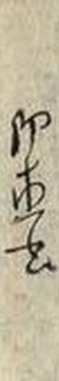御直書
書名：少傅日録抄（斉承付側向頭取日記、在国）
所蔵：福井県文書館 Fukui Prefectural Archives
